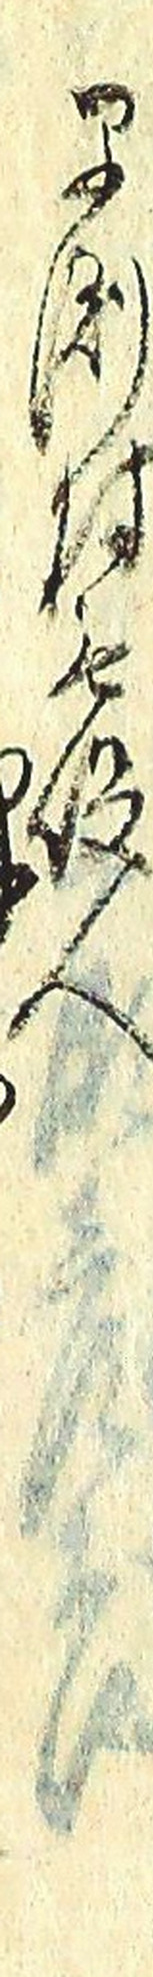早渕村無役人
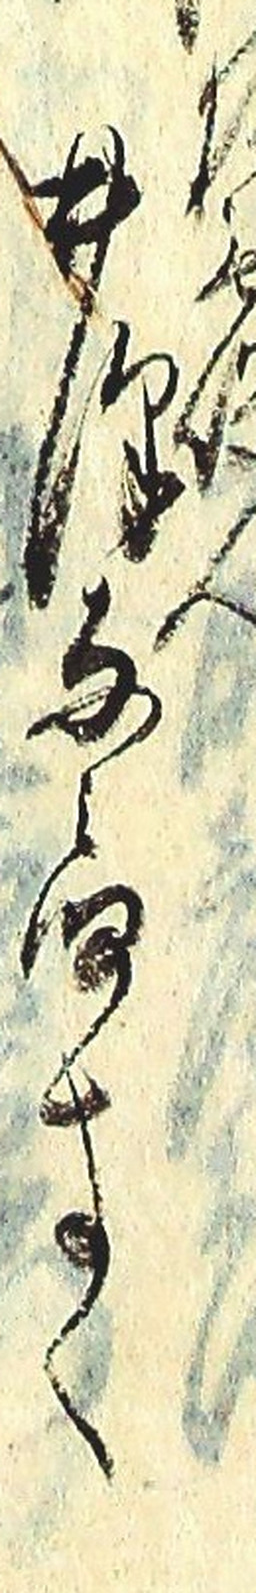井沢与三郎方へ
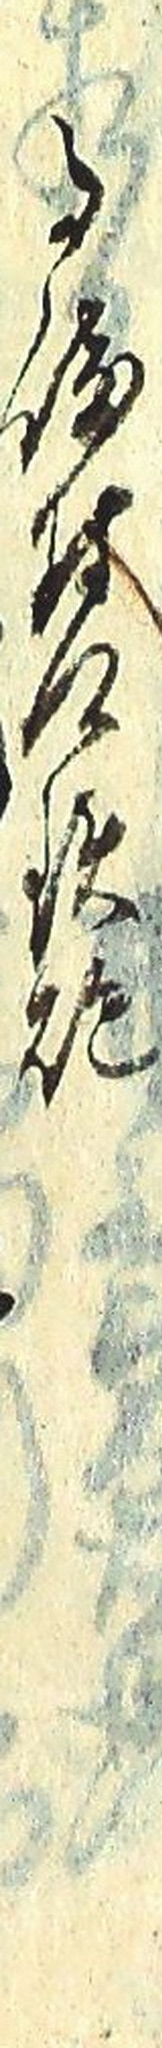高崎村郷鉄砲
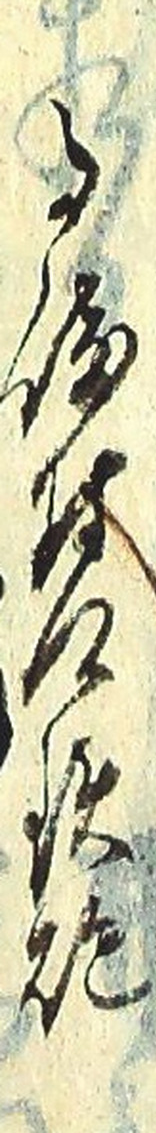高崎村郷鉄砲
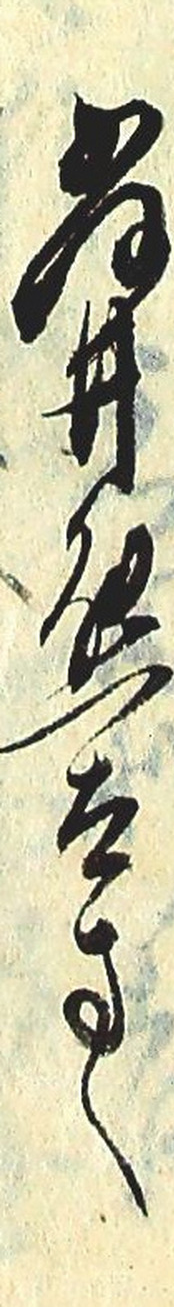有井熊太方へ
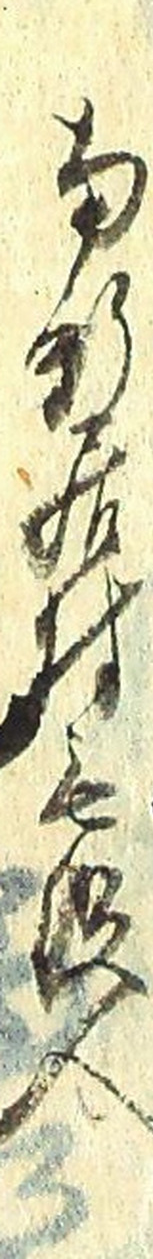南新居村無役人
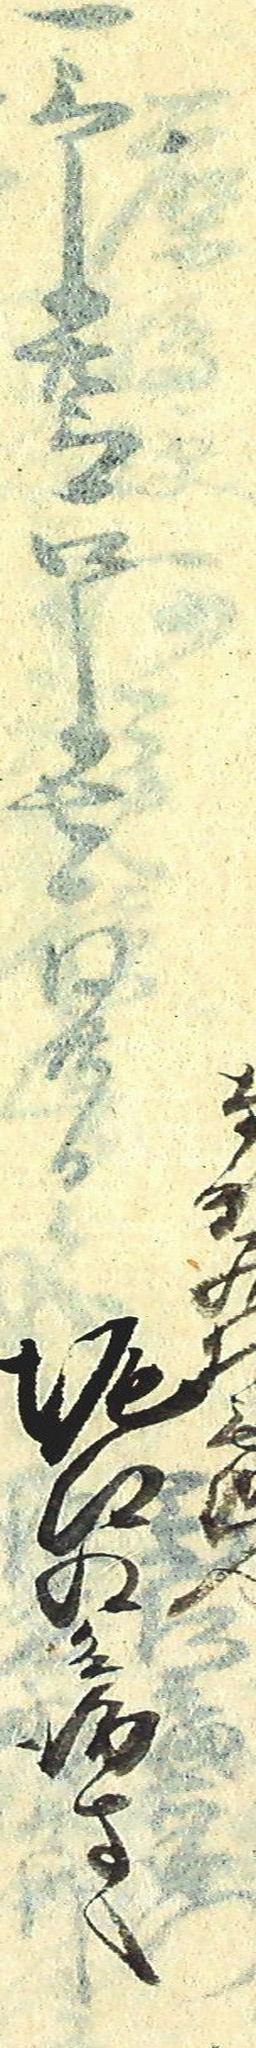堀江九兵衛方へ
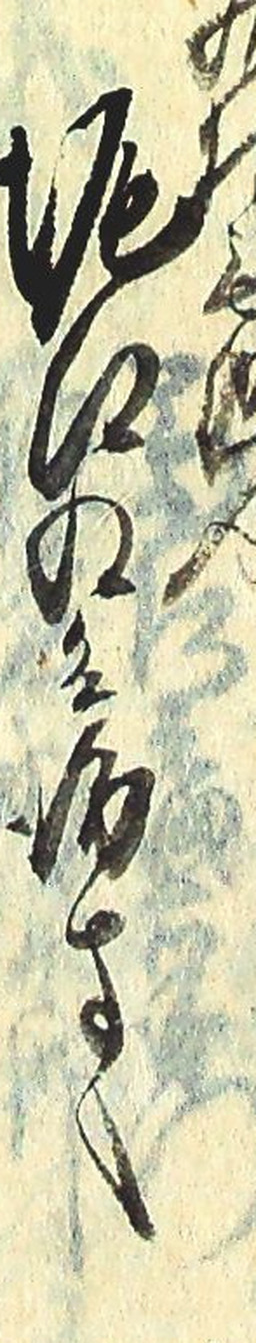堀江九兵衛方へ
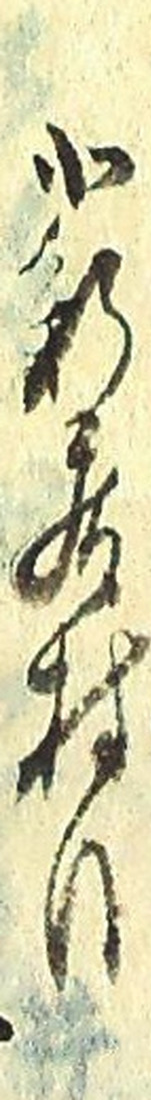北新居村同
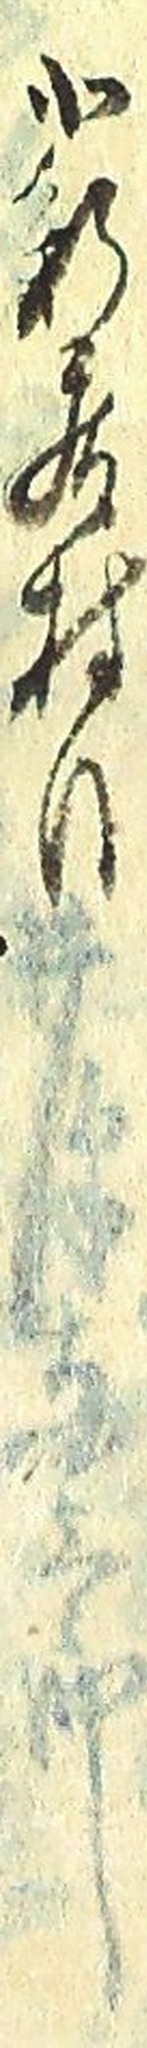北新居村同
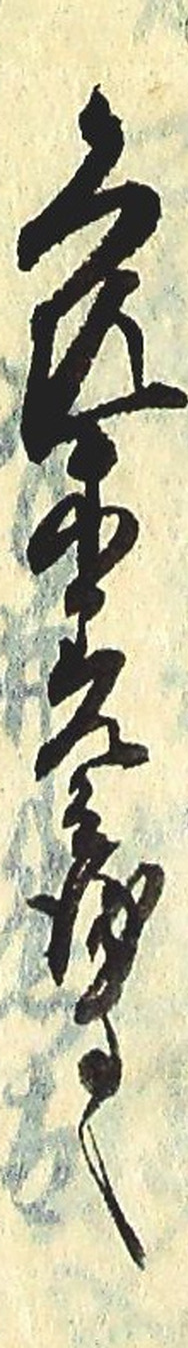久須米善兵衛方へ
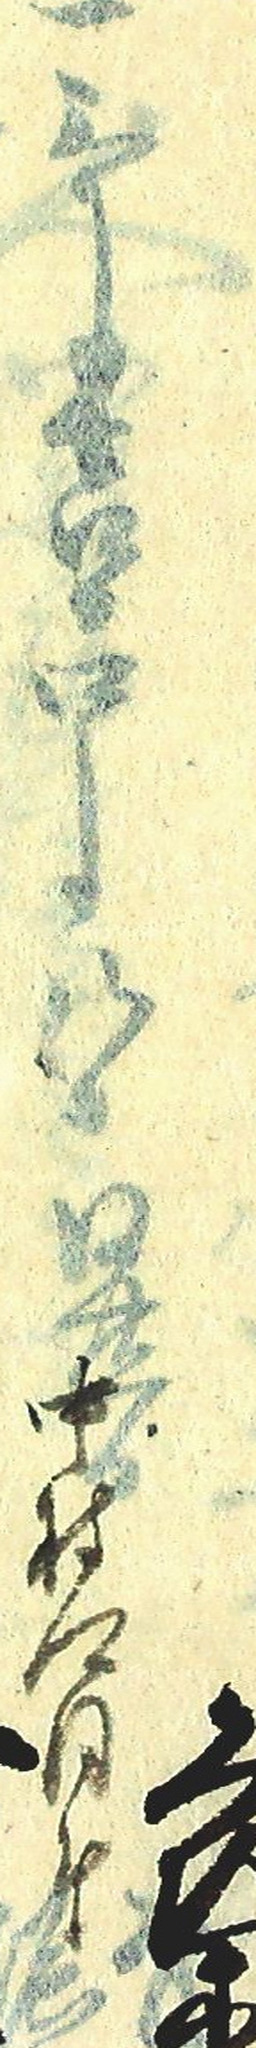中村郷目付
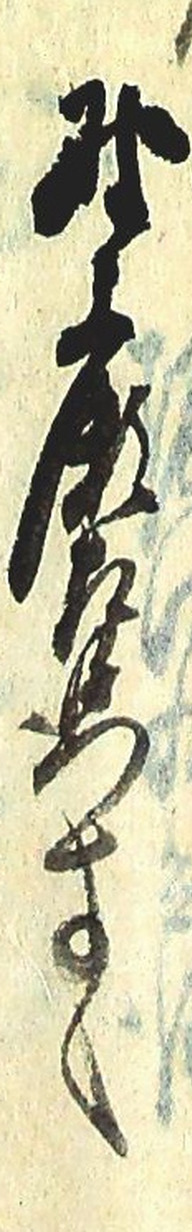野上瀬左衛門方へ
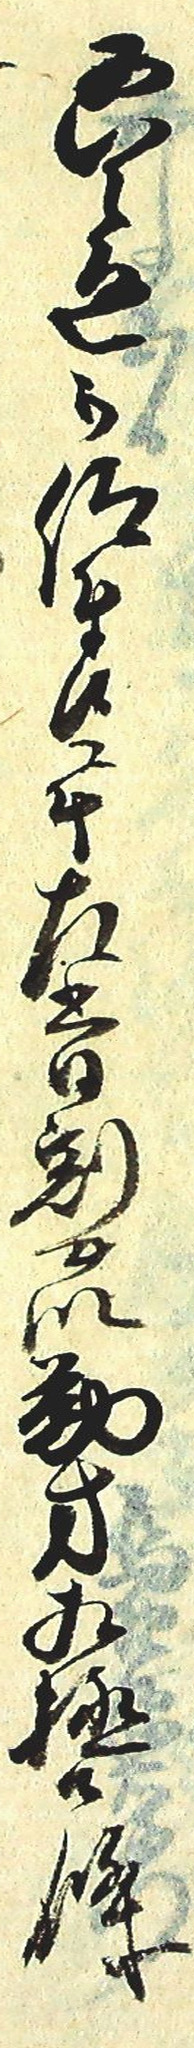右之通被仰付候に付左書日割を以勤方相極候条
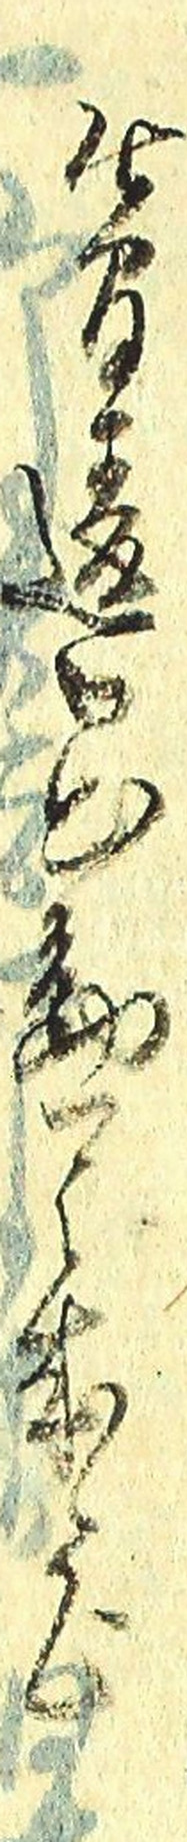無間違御出勤可被成候以上
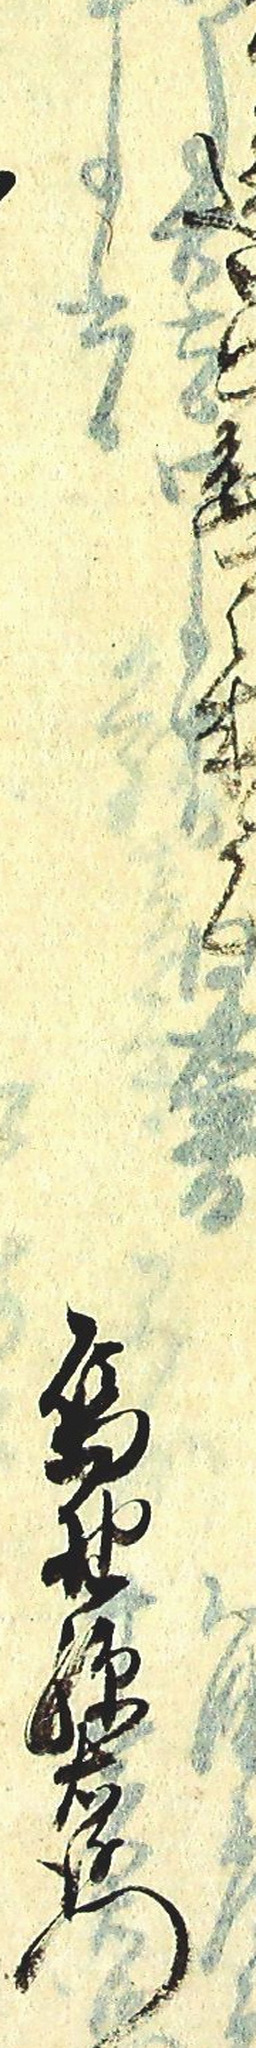鷹野孫右衛門
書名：諸御願書控(弐番）
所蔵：鳴門教育大学 Naruto University of Education
